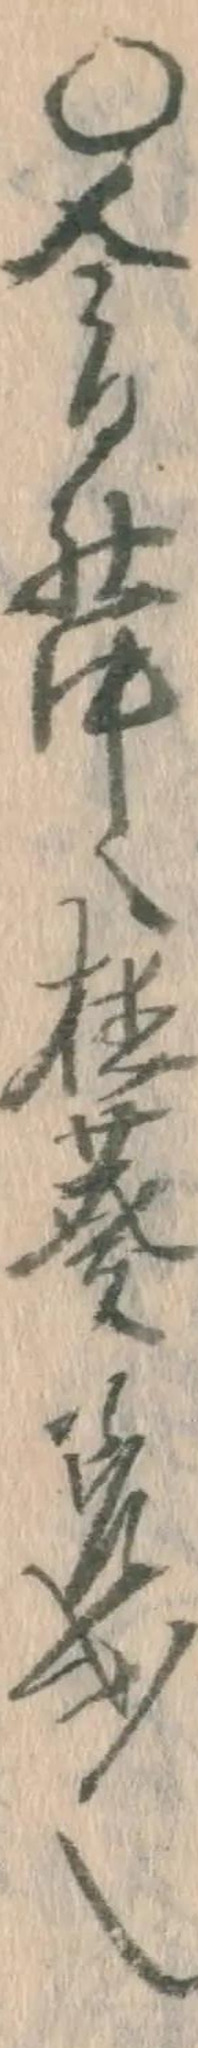○今日社中へ植葵差出也
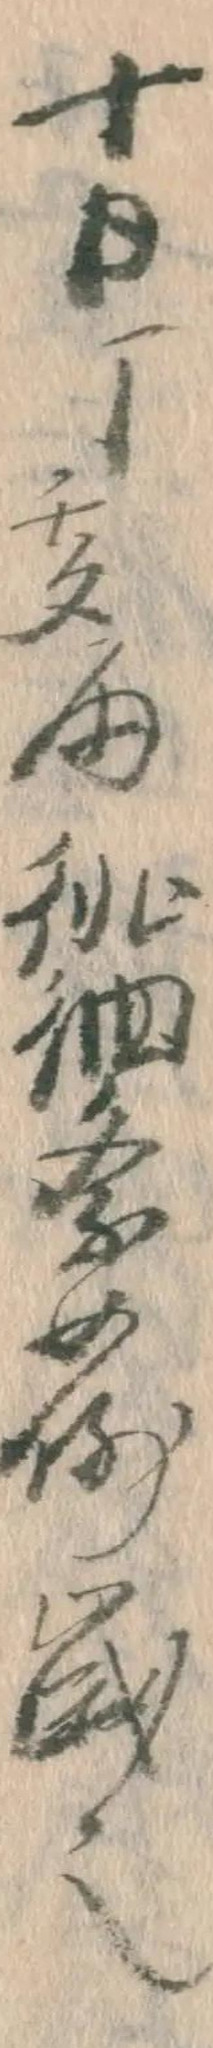十日丁亥雨徘徊祭如例歳々
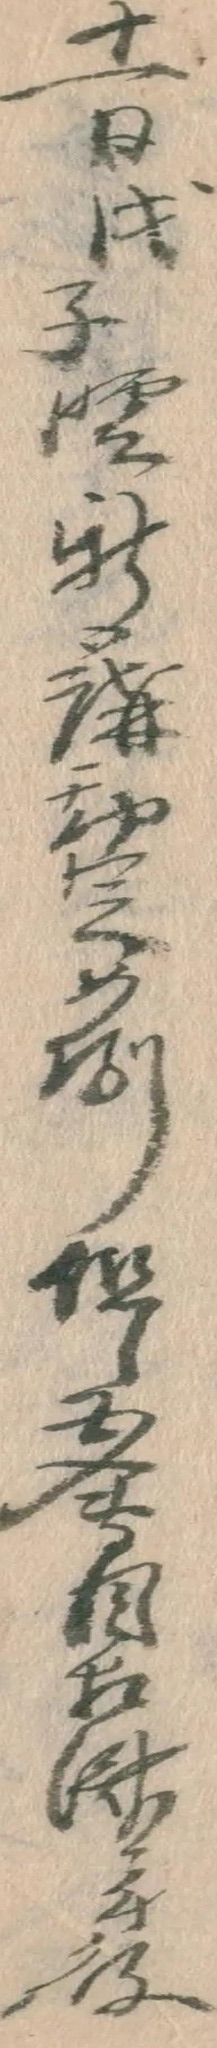十一日戊子晴曇新御講勘定如例但し五會目相済ニ付役
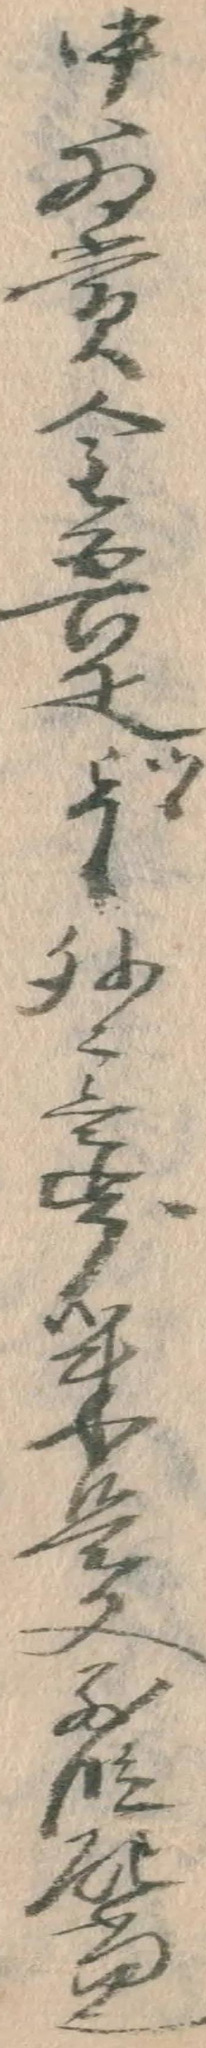中へ為賞金五百疋ツヽ被下外ニ壱歩弐朱是又別段配当也
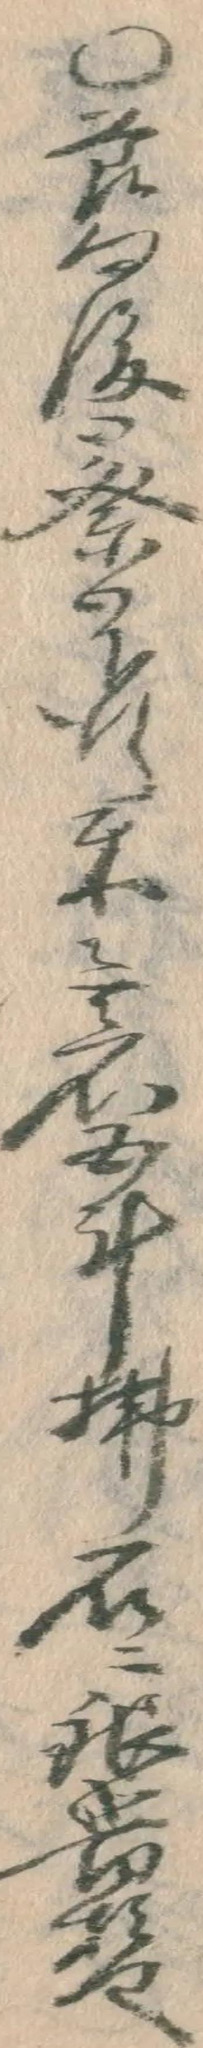○節向後御祭御下行来壱石五斗払石二銀弐百拾匁
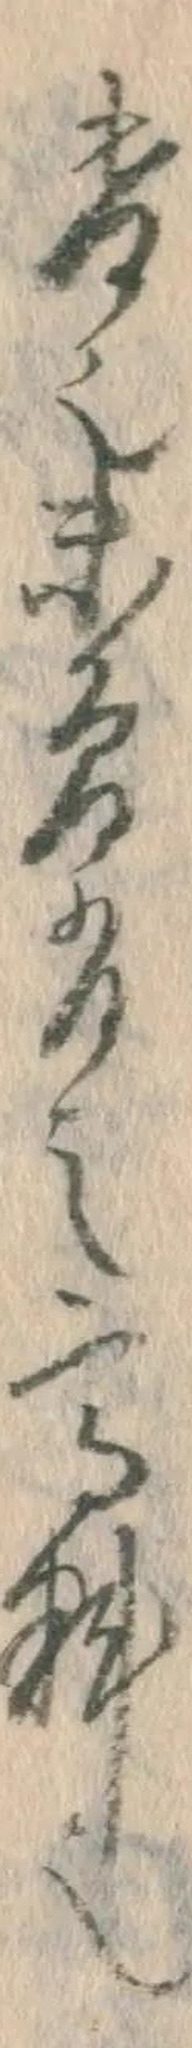替也未曾有之高料也
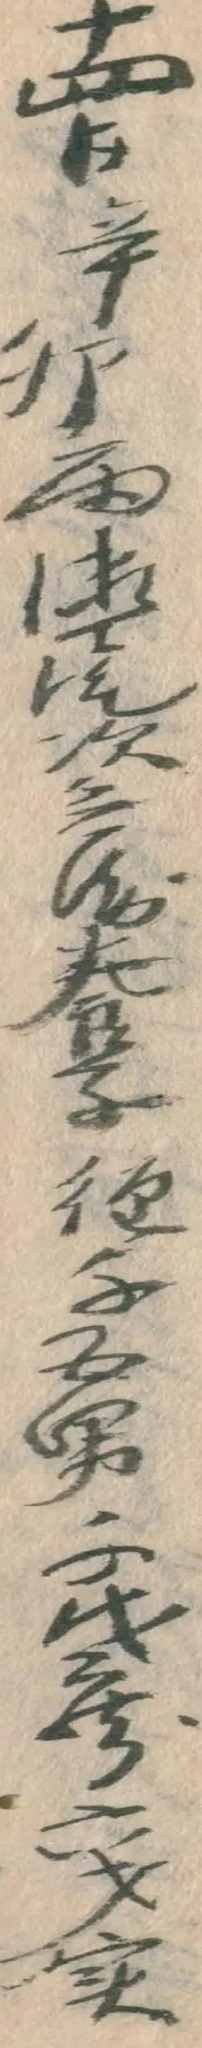十四日辛卯雨瀬尾次兵衛養子経千五男千代蔵六才実
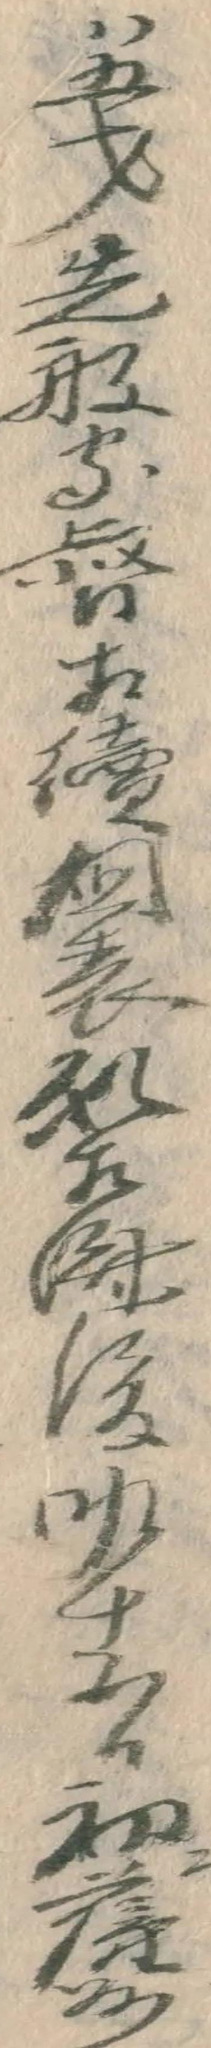ハ五才先般家督相續国表願相済後明十五日初而薩州
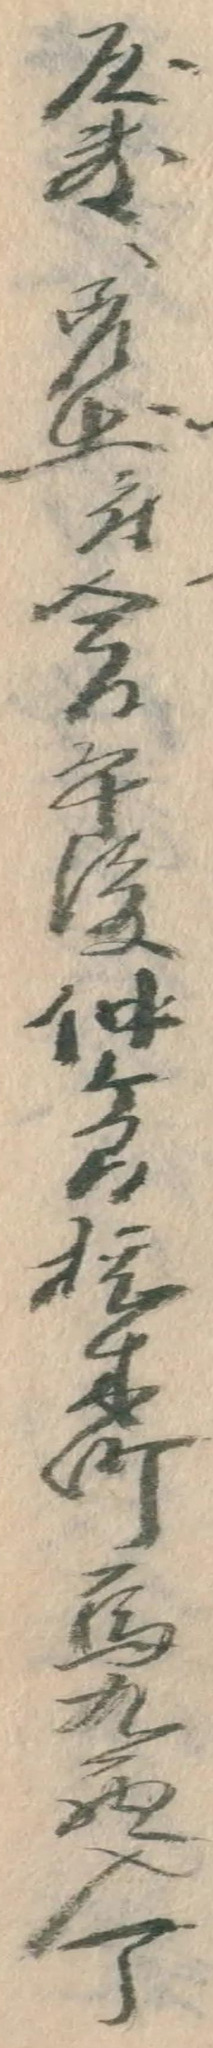屋敷へ差出ニ付今日午後仲ヶ間木町烏丸西入丁

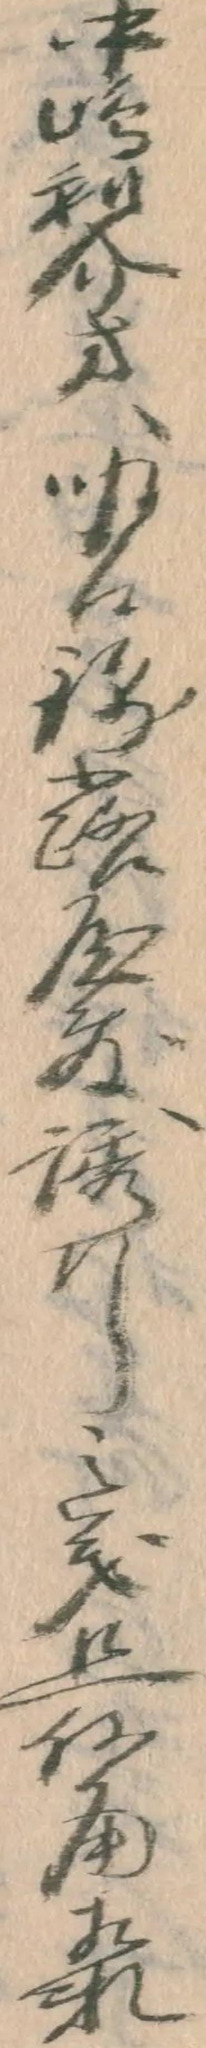中嶋和介方へ明口銭小路屋敷誘引之義且何角相頼
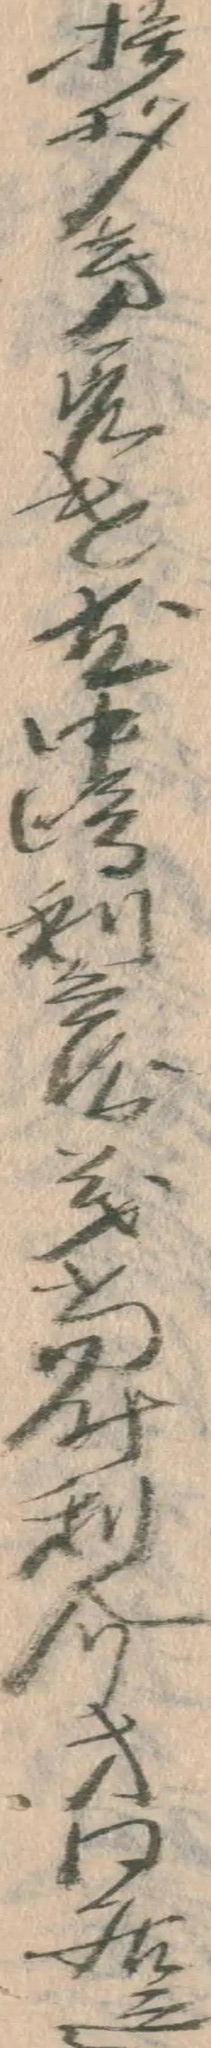挨拶旁差遣尤中嶋利兵衛義當時利介方同居云々
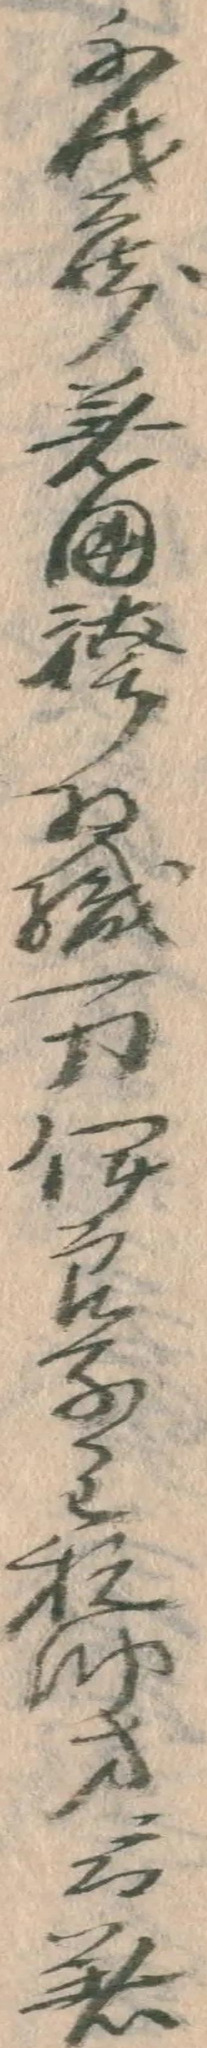千代蔵着用袴羽織一刀伊良子主税助方ニ而着
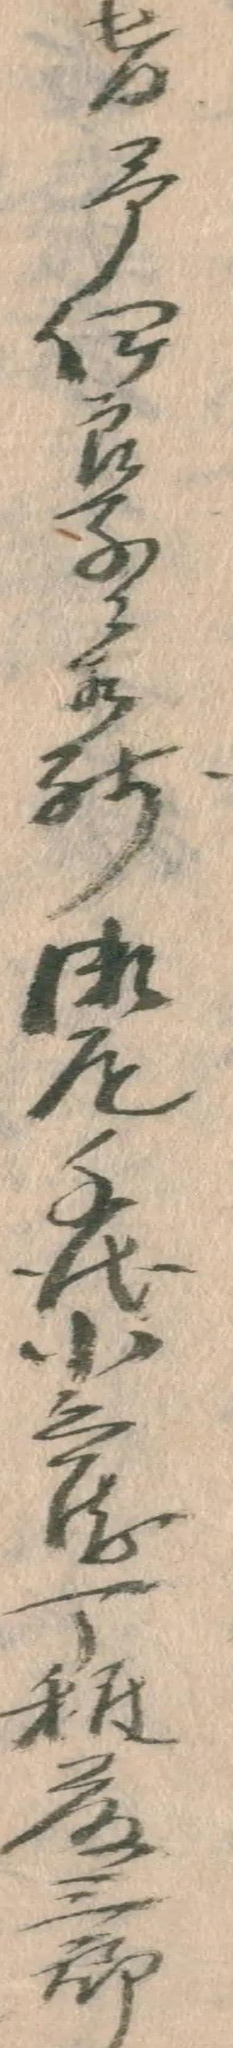旨予伊良子ニ相残瀬尾手代小兵衛丁稚藤三郎
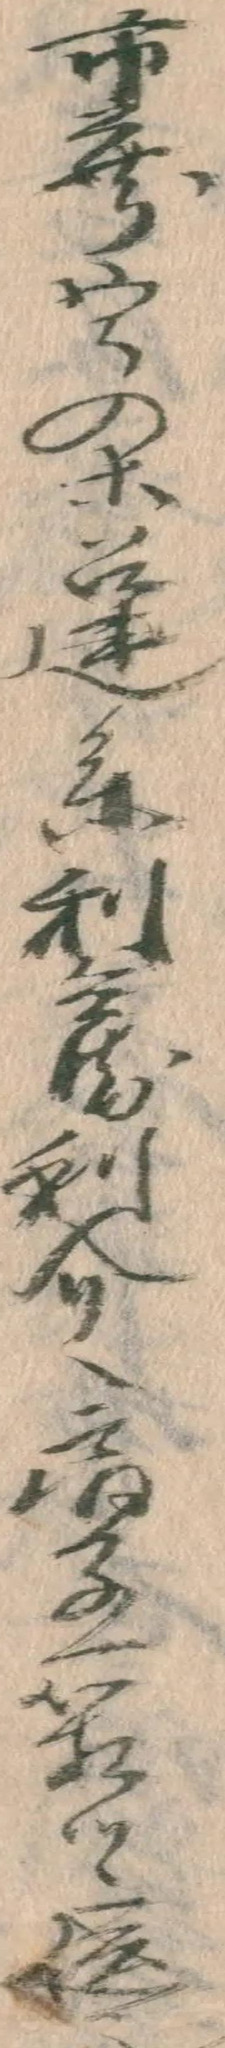市蔵うの等召連参利兵衛利介へ扇子一箱ツヽ送之
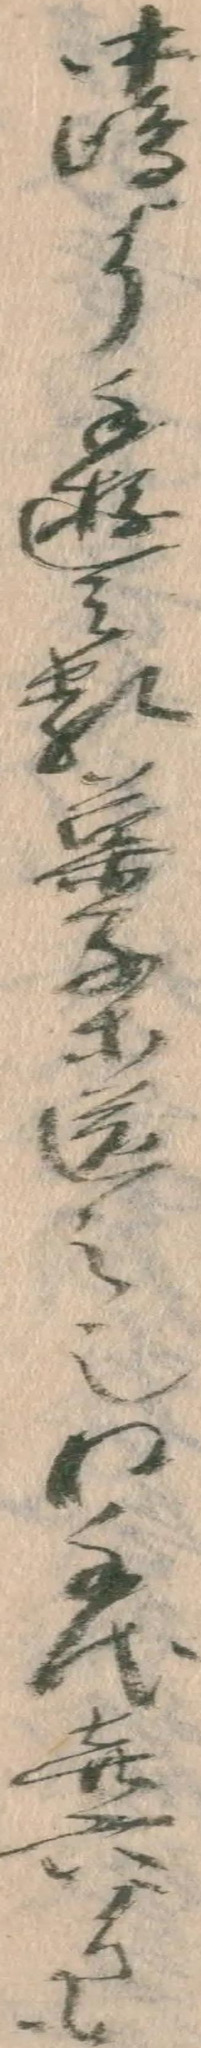中嶋より手遊之類菓子等送之也同手代喜六よりも
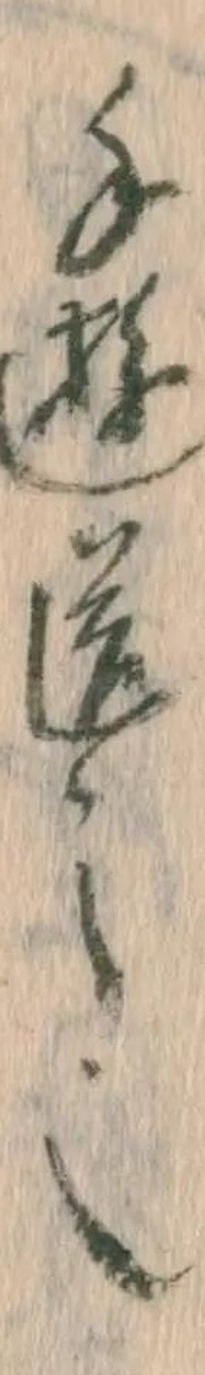手遊送之也
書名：賀茂社記録. 第67冊
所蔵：国立国会図書館 National Diet Library, JAPAN
